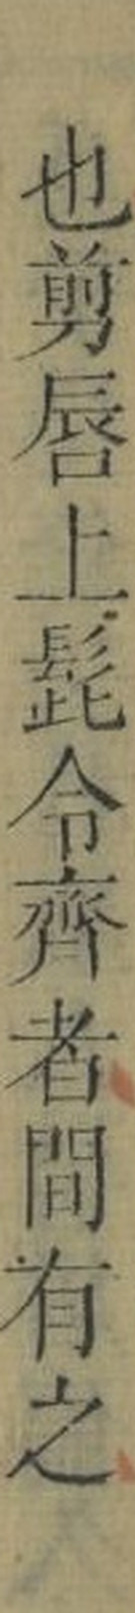也剪唇上髭令斉者間有之
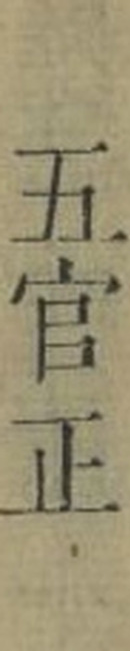五官正
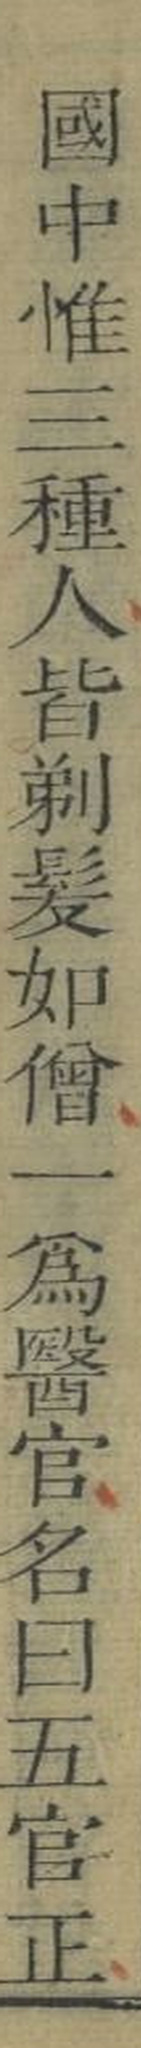国中惟三種人皆剃髪如僧一為医官名曰五官正
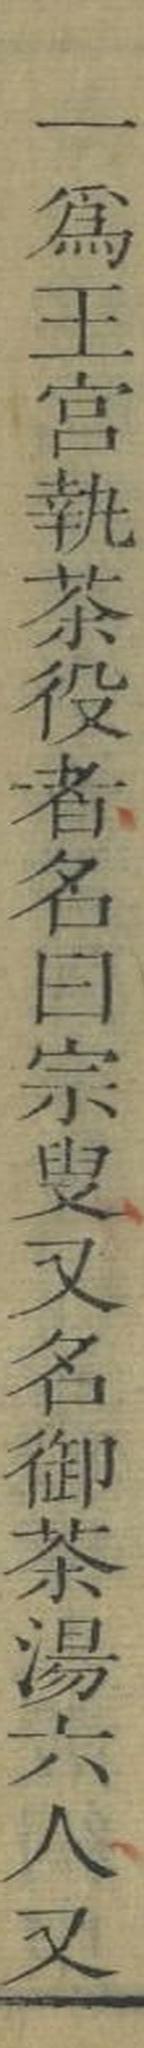一為王宮執茶役者名曰宗叟又名御茶湯六人又
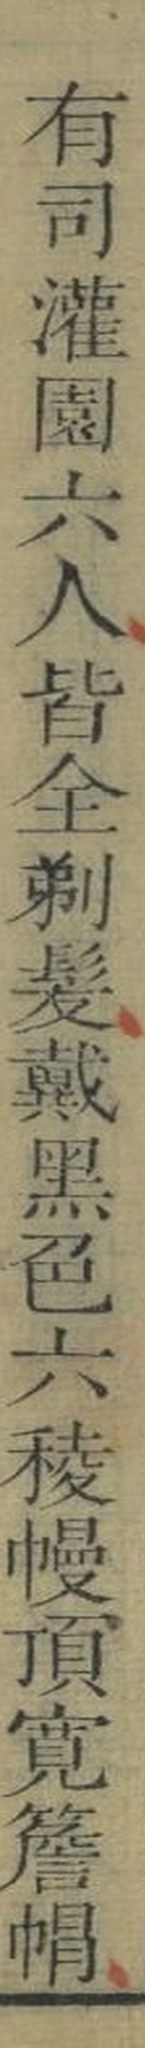有司灌園六人皆全剃髪戴黒色六稜幔頂寛簷帽
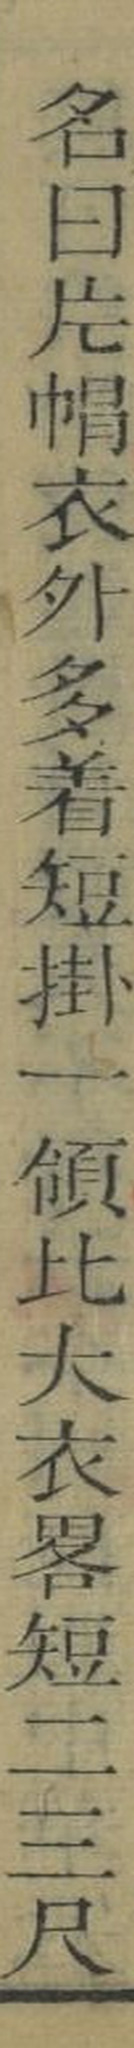名曰片帽衣外多着短掛一領比大衣略短二三尺
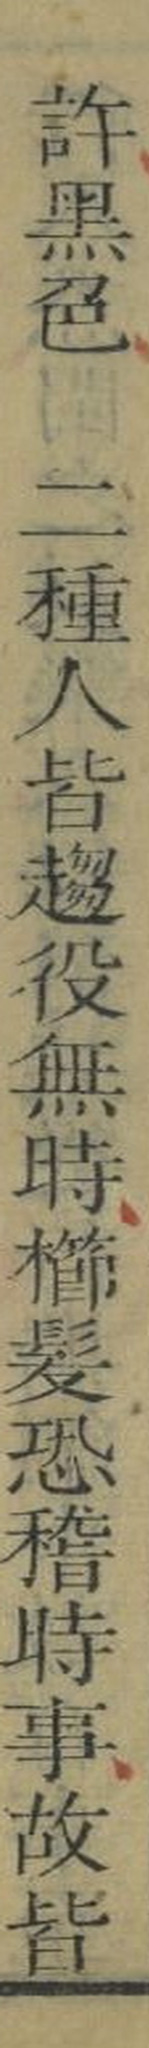許黒色二種人皆趨役無時櫛髪恐稽時事故皆
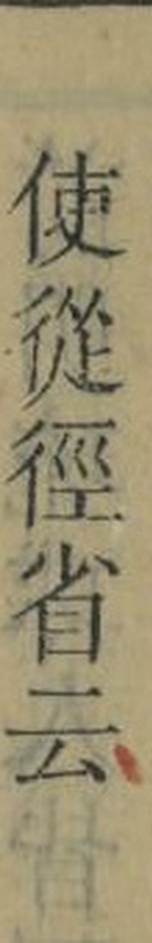使従径省云

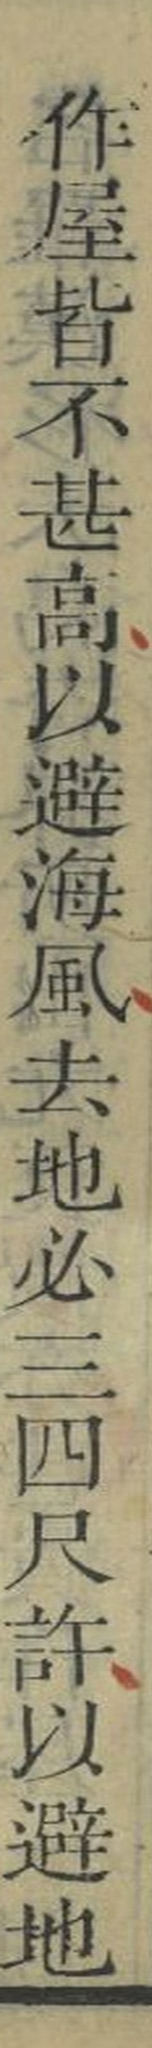作屋皆不甚高以避海風去地必三四尺許以避地
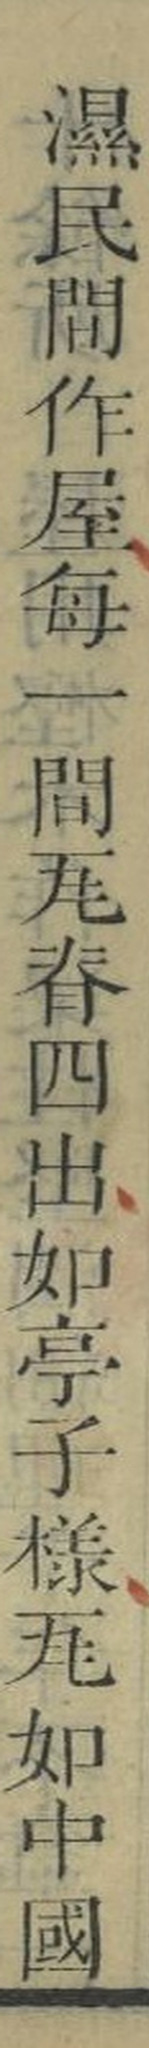湿民間作屋毎一間瓦脊四出如亭子様瓦如中国
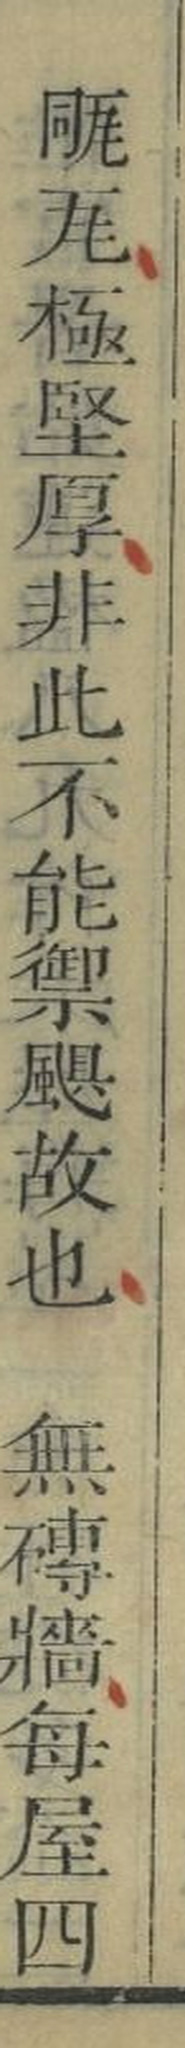瓦極堅厚非此不能禦颶故也無磚牆毎屋四
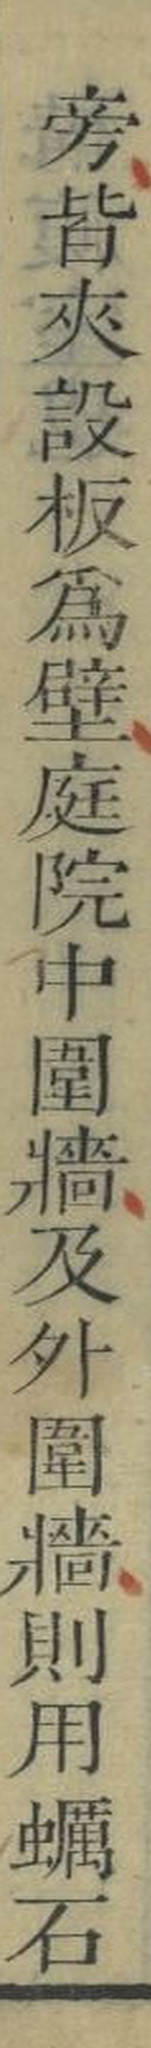旁皆夾設板為壁庭院中囲牆及外囲牆則用蠣石
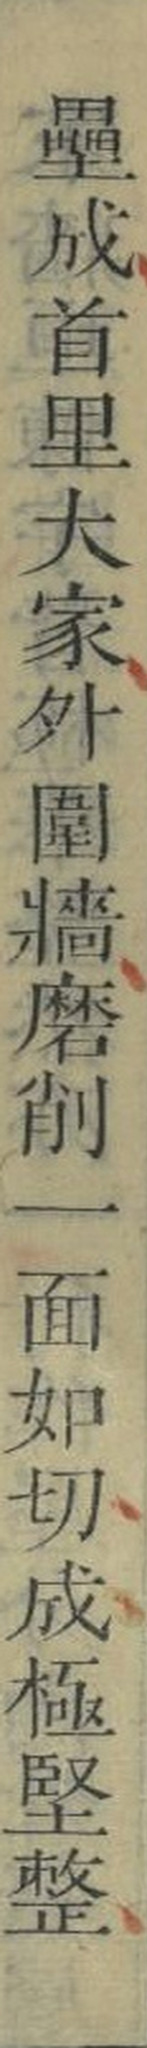壘成首里大家外囲牆磨削一面如切成極堅整
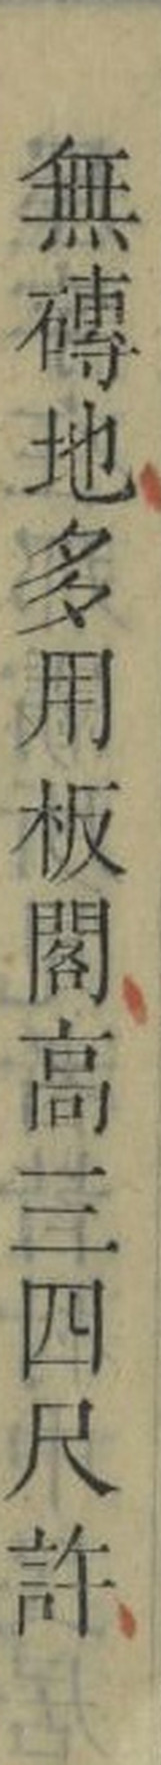無磚地多用板閣高三四尺許
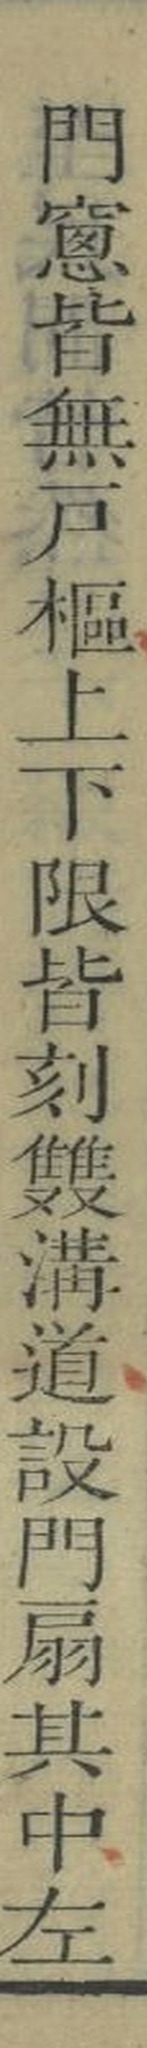門窓皆無戸枢上下限皆刻双溝道設門扇其中左
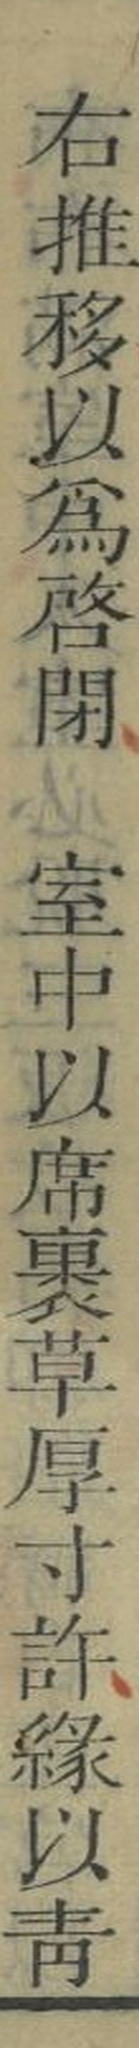右推移以為啓閉室中以席裹草厚寸許縁以青
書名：中山伝信録 巻六
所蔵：University of the Ryukyus Library
